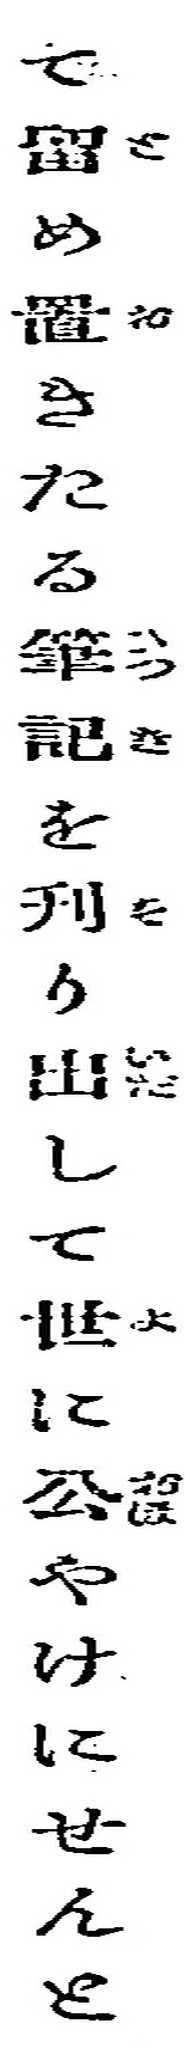て留め置きたる筆記を刊り出して世に公やけにせんと
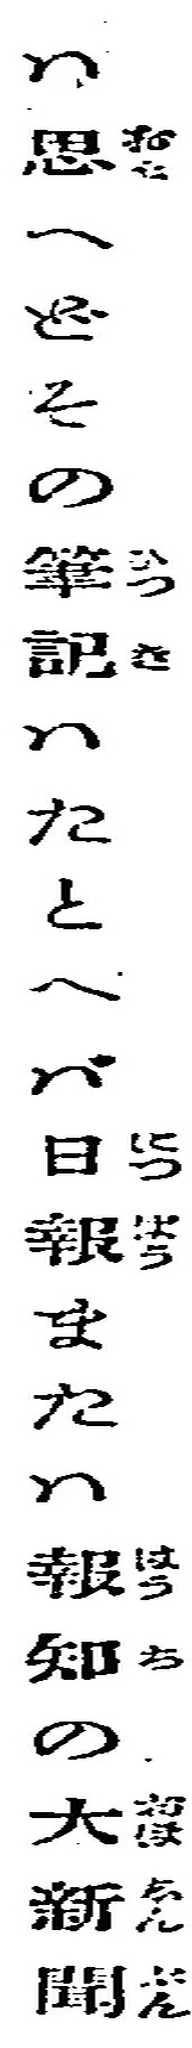は思へどその筆記はたとへば日報または報知の大新聞
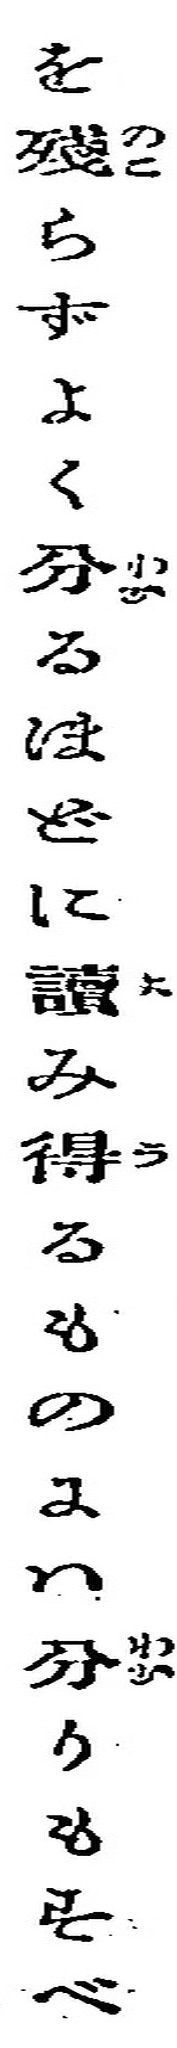を残らずよく分るほどに讀み得るものには分りもすべ
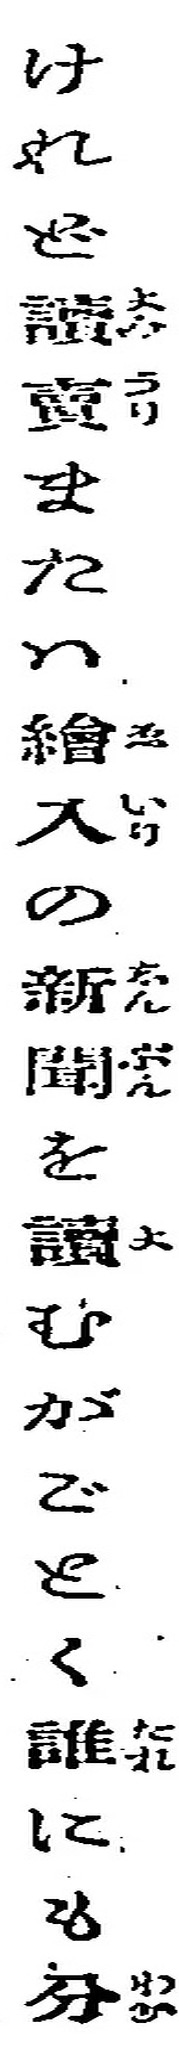けれど讀賣または繪画の新聞を讀むがごいとく誰にも分
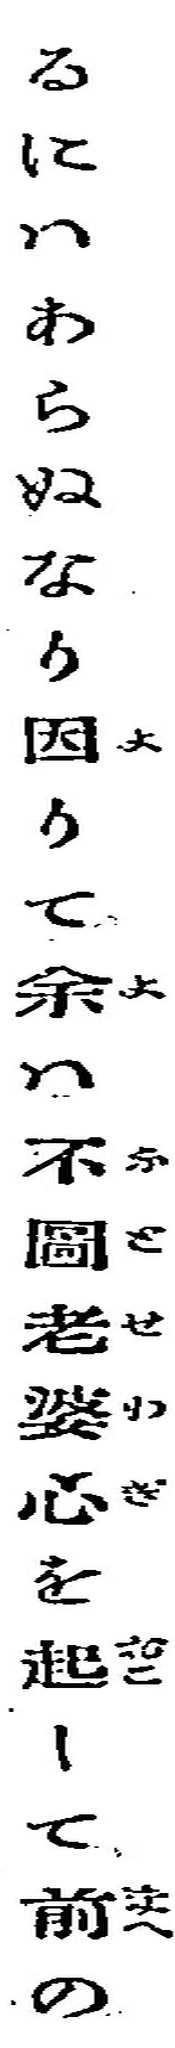るにはあらぬなり因りて余は不圖老婆心を起して前の
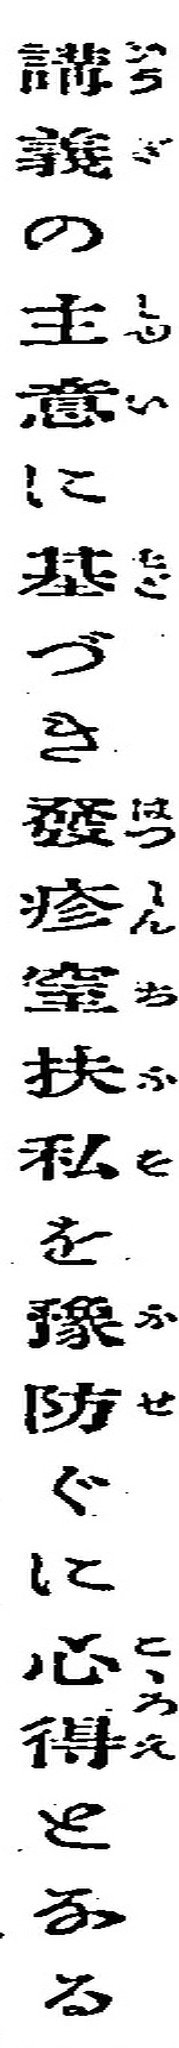講義の主意に基づき発疹窒扶斯を豫防ぐに心得となる
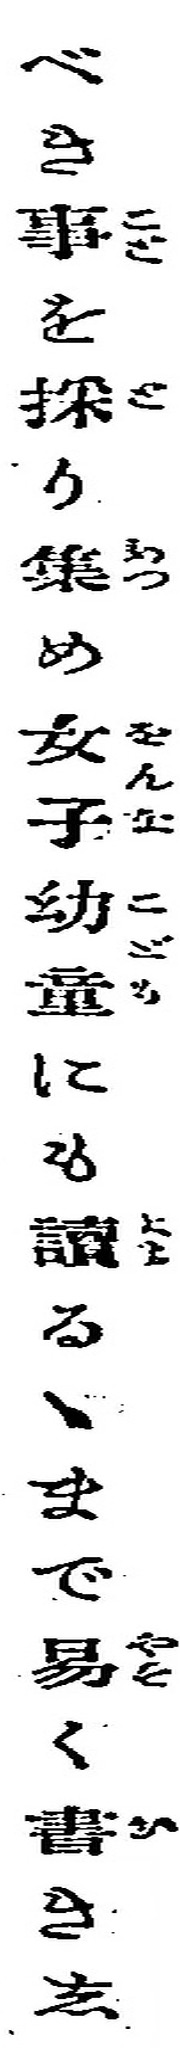べき事を採り集め女子幼童にも讀るゝまで易く書きし
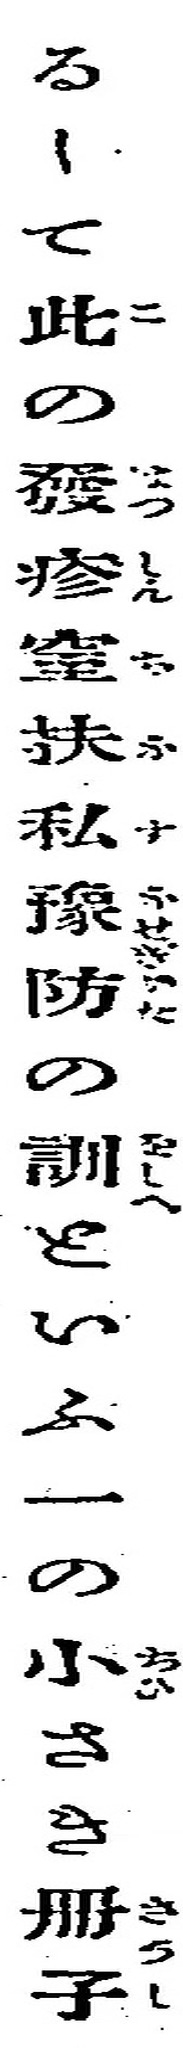るして此の発疹窒扶斯豫防の訓といふ一の小さき冊子
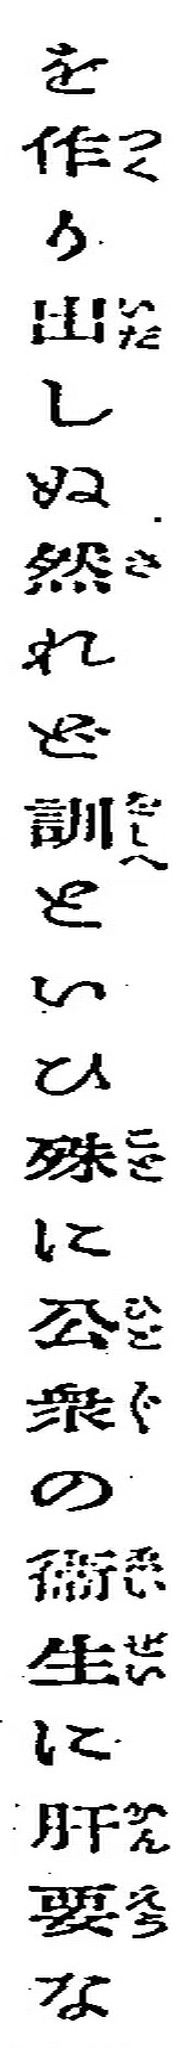を作り出しぬ然れど訓といひ殊に公衆の衛生に肝要な
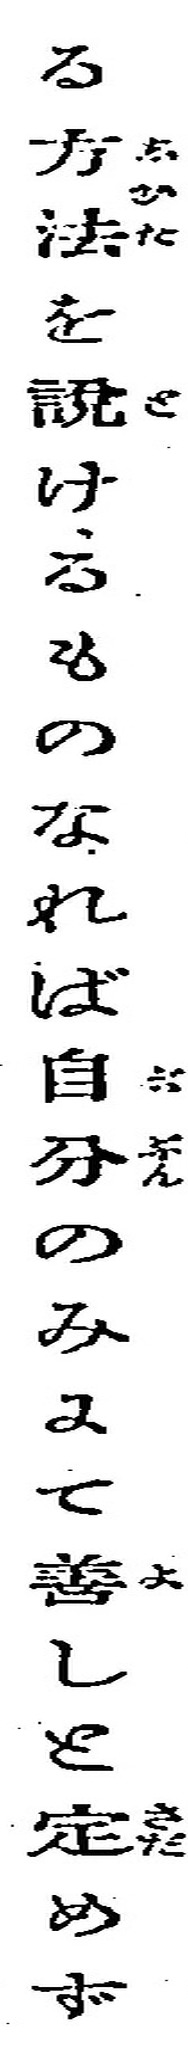る方法を説明けるものなれば自分のみにて善しと定めず
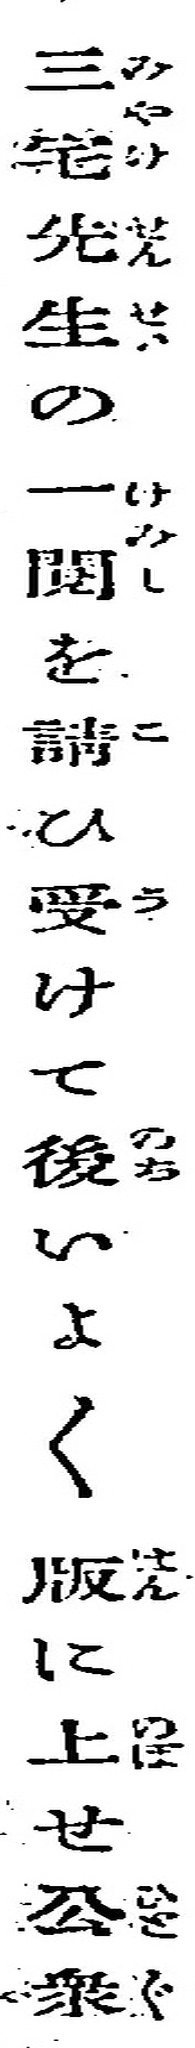三宅先生の一閲を請ひ受けて後いよ〳〵版に上せ公衆
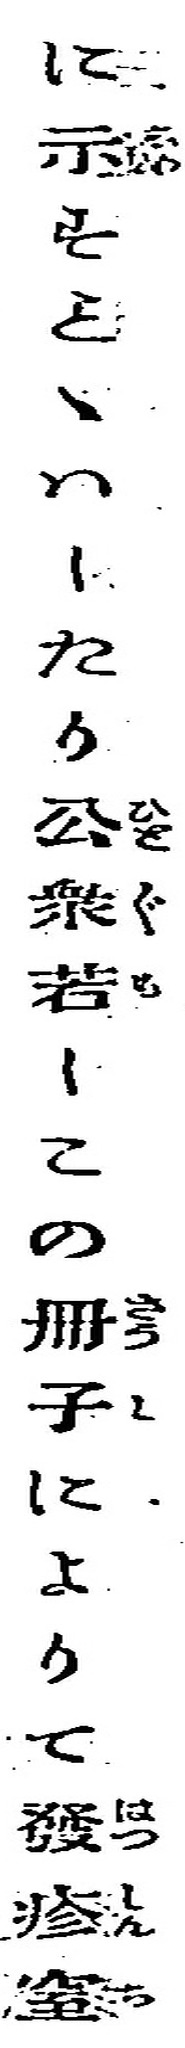に示すことゝはしたり公衆若しこの冊子によりて発疹窒
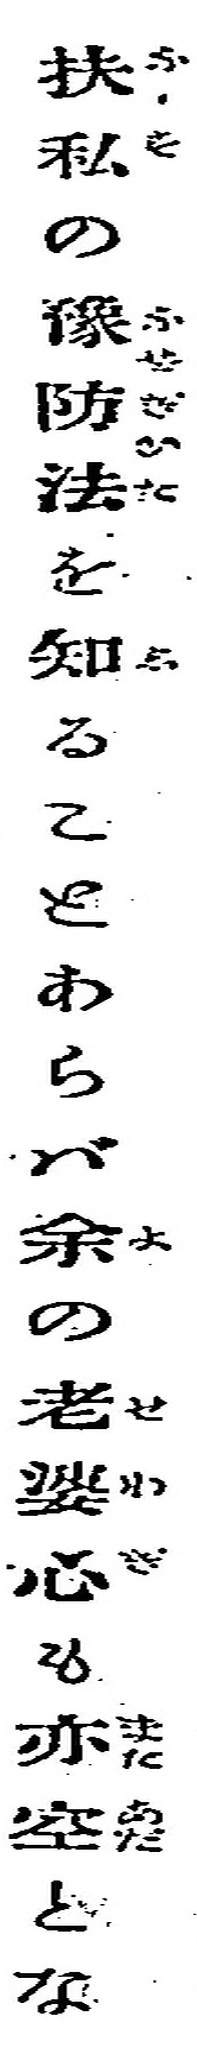扶私の豫防法をｑ知ることあらば余の老婆心も亦空とな
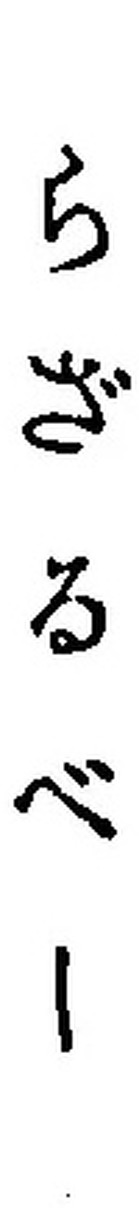らざるべし
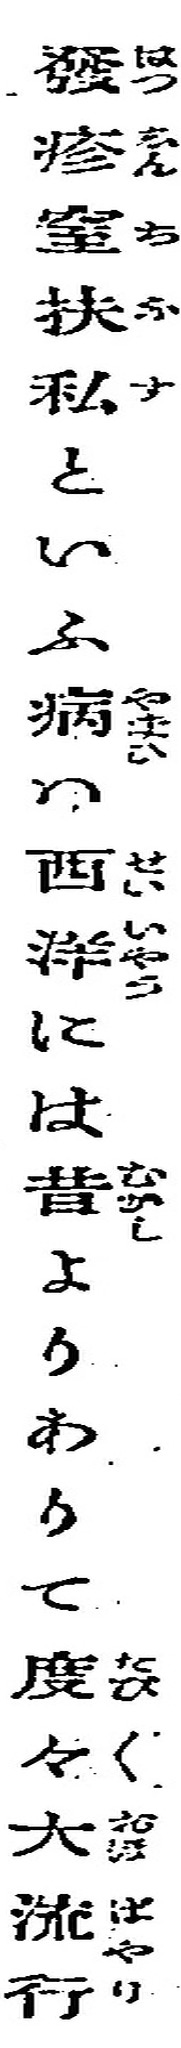発疹窒扶私といふ病は西洋には昔よりありて度々大流行
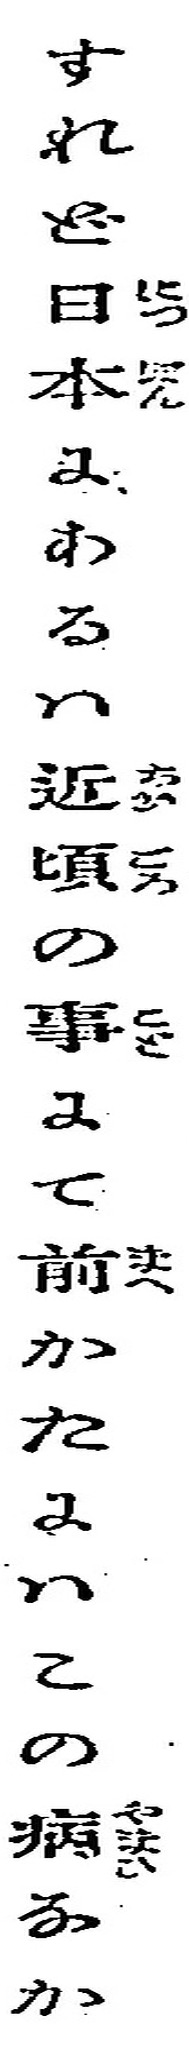すれど日本にあるは近頃の事にて前かたにはこの病なか
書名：発疹窒扶私予防の訓
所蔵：国立国会図書館 National Diet Library, JAPAN
